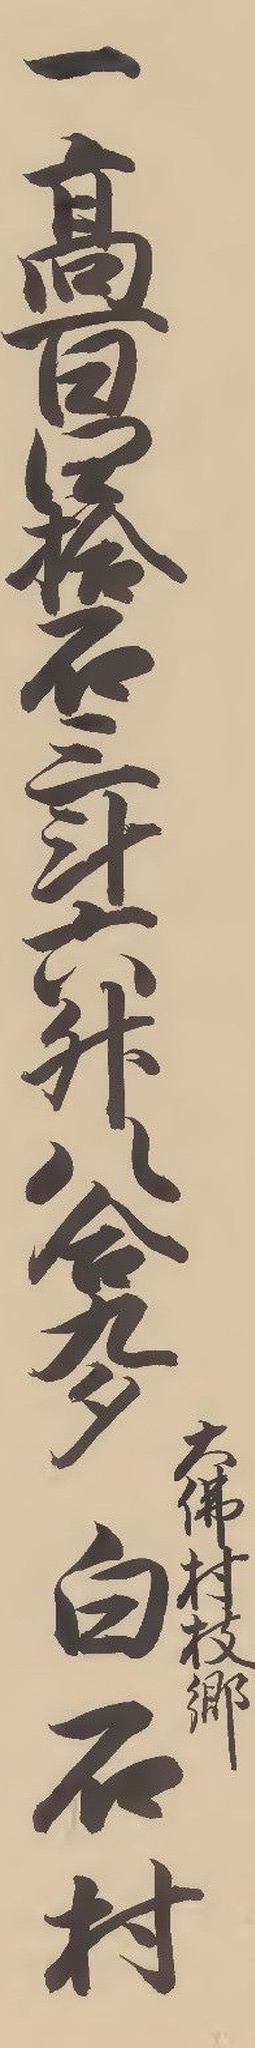一高百四拾石三斗六升八合九勺白石村
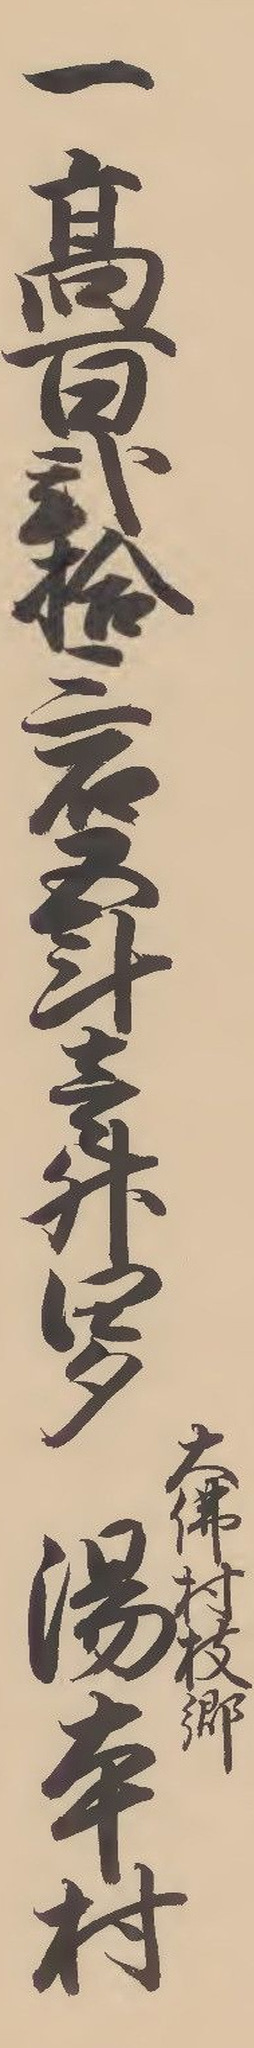一高百弐拾三石五斗壱升四勺湯本村

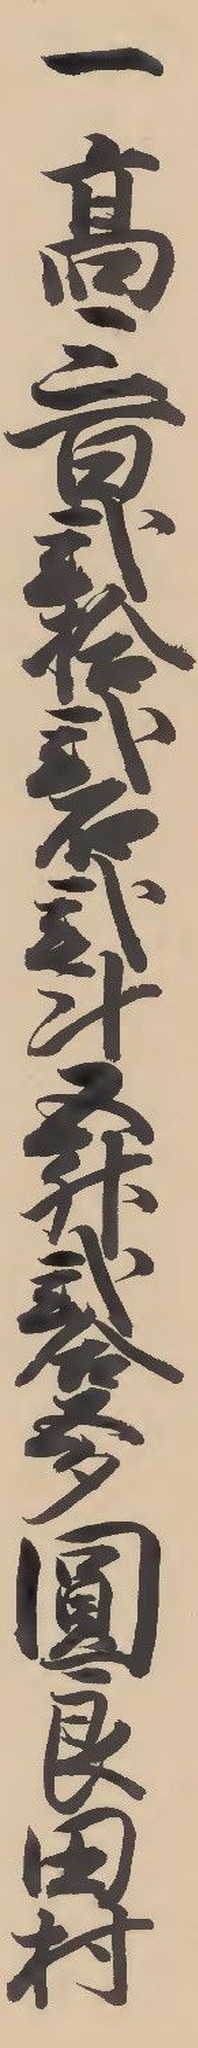一高三百弐拾弐石弐斗五升弐合五勺円良田村
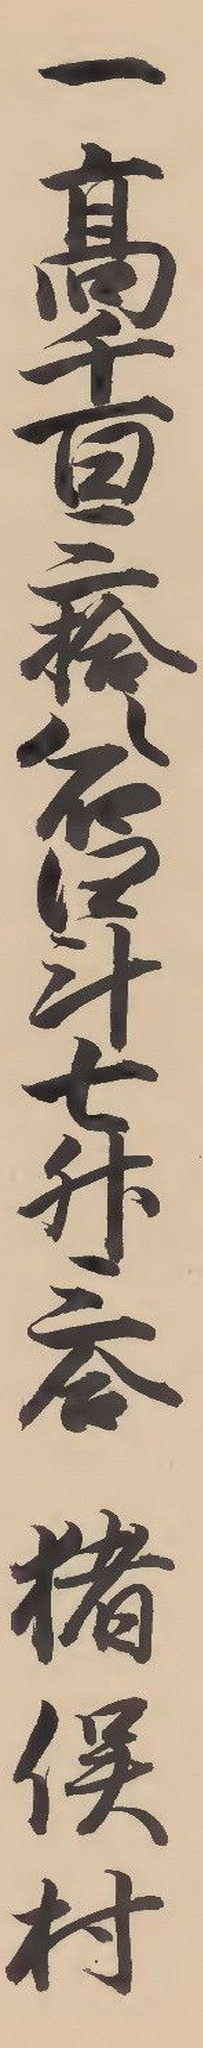一高千百三拾八石四斗七升三合猪俣村
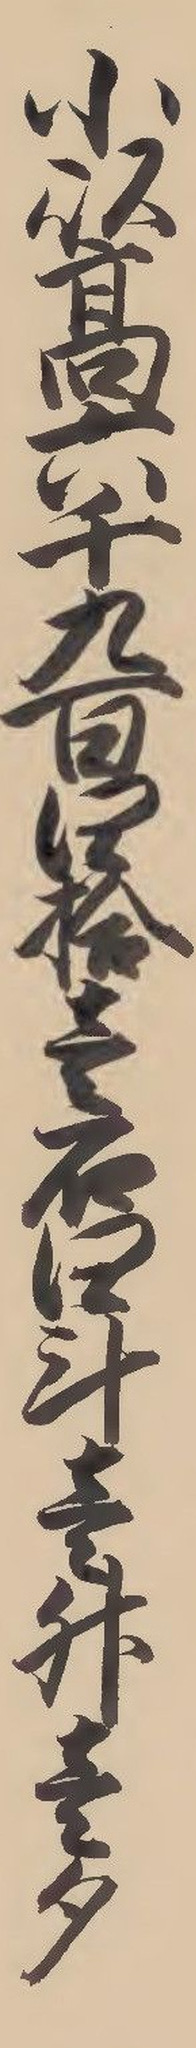小以高六千九百四拾壱石四斗壱升壱勺
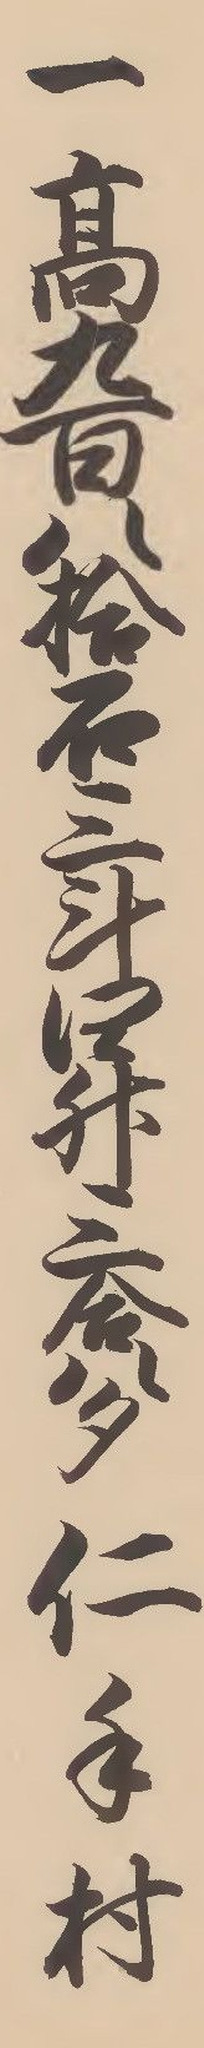一高九百八拾石三斗四升三合八勺仁手村
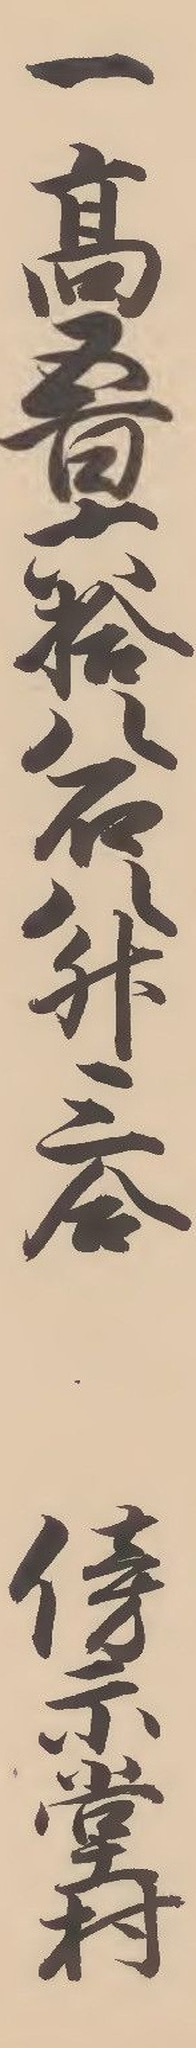一高五百六拾八石八升三合傍示堂村
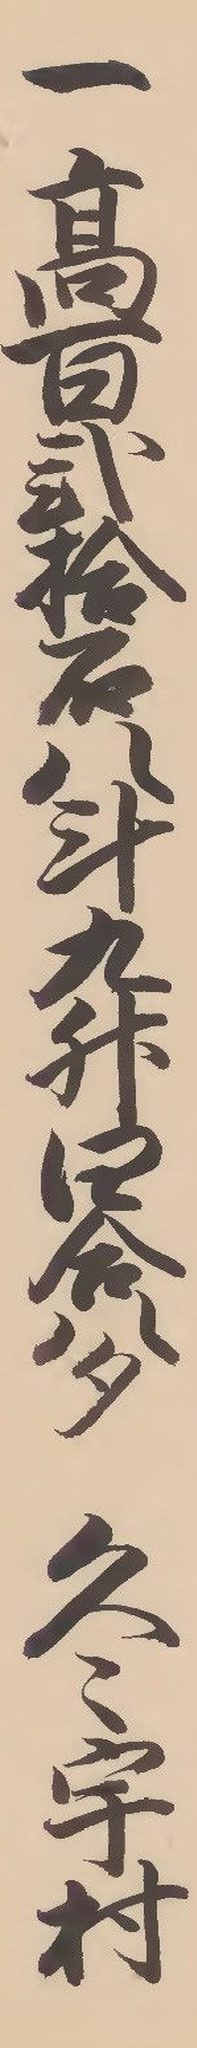一高百弐拾石八斗九升四合八勺久々宇村

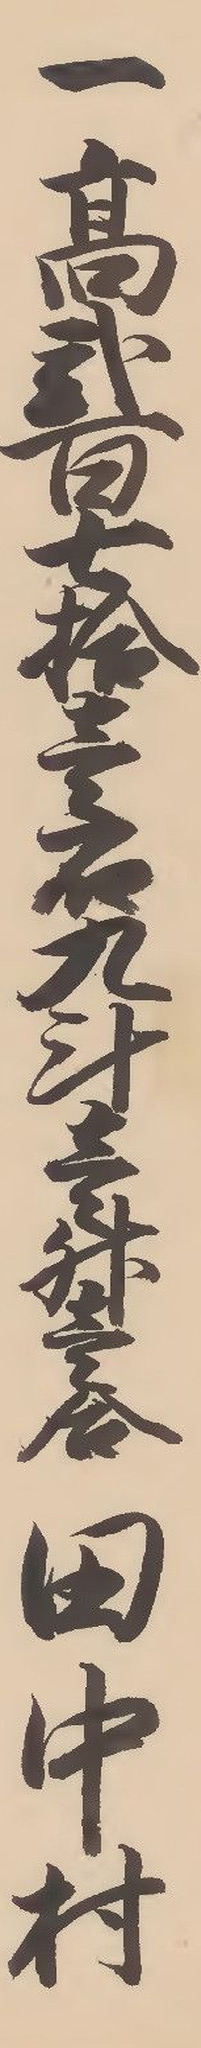一高弐百七拾壱石九斗壱升壱合田中村
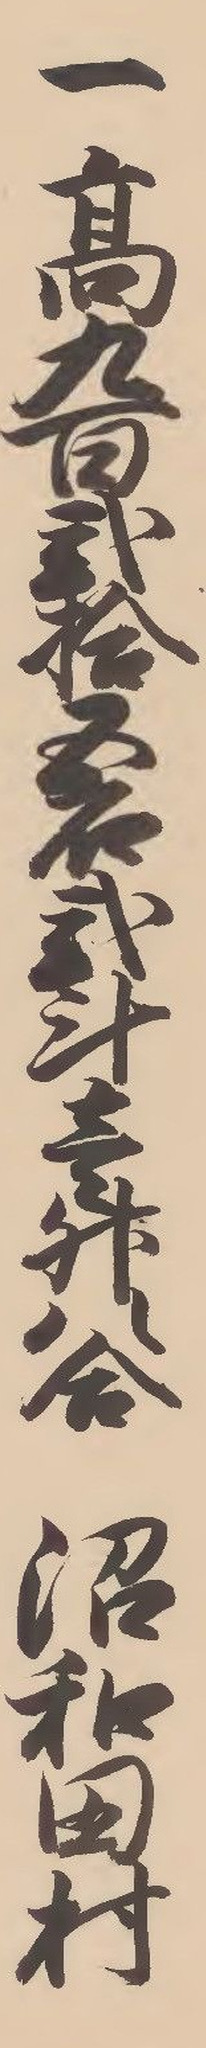一高九百弐拾五石弐斗壱升八合沼和田村
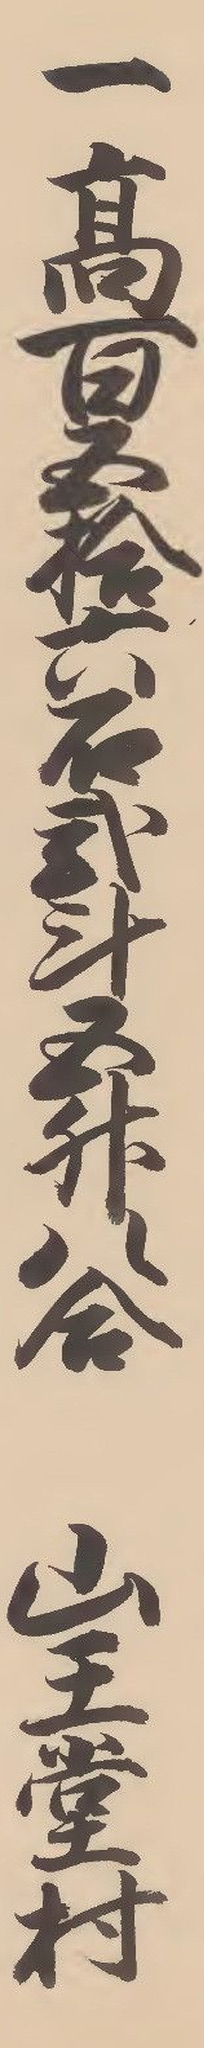一高百五拾六石弐斗五升八合山王堂村
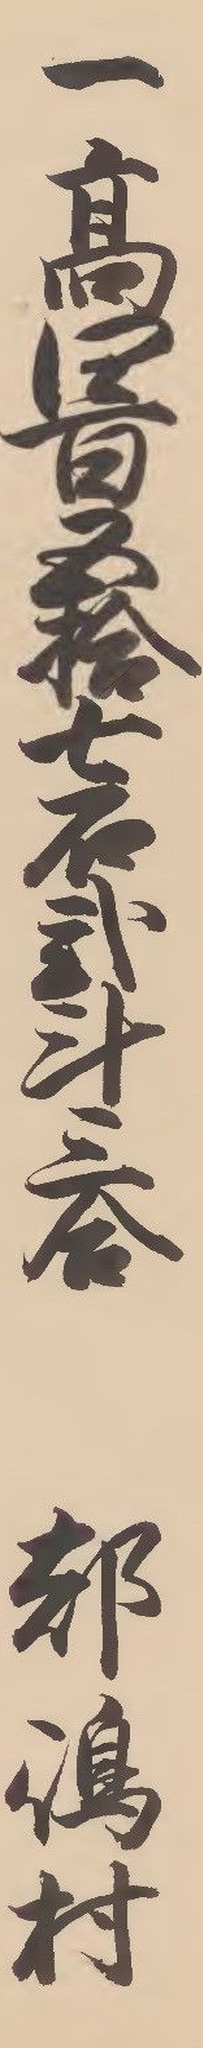一高四百五拾七石弐斗三合都嶋村
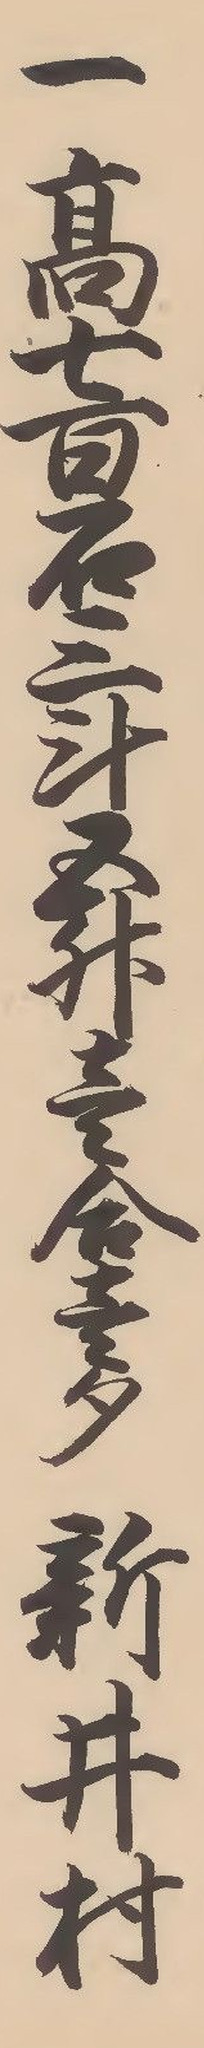一高七百石三斗五升壱合壱勺新井村
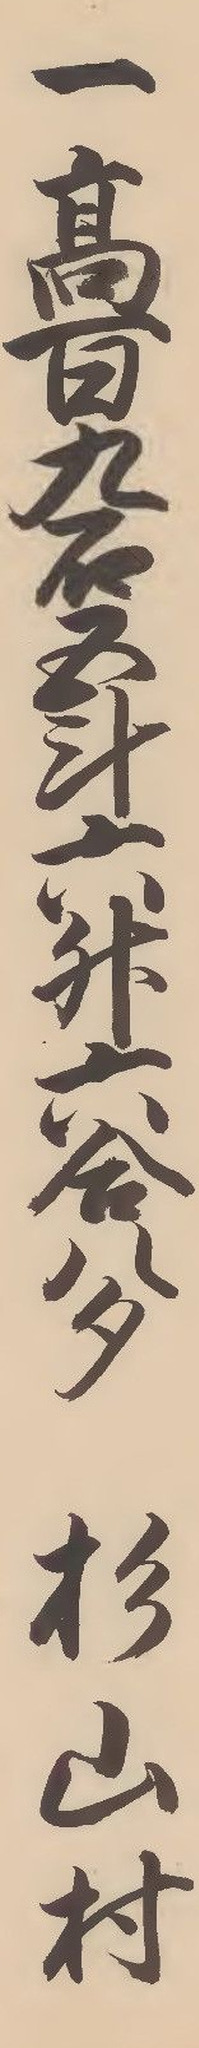一高百九石五斗六升六合八勺杉山村
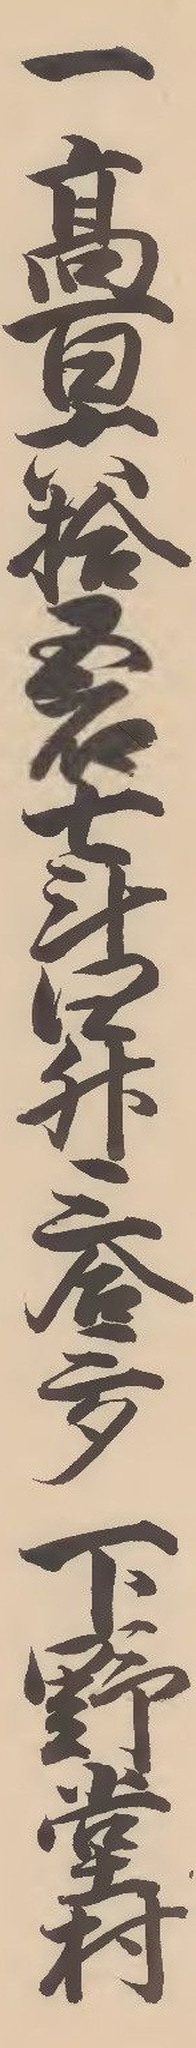一高百六拾五石七斗四升三合三勺下野堂村
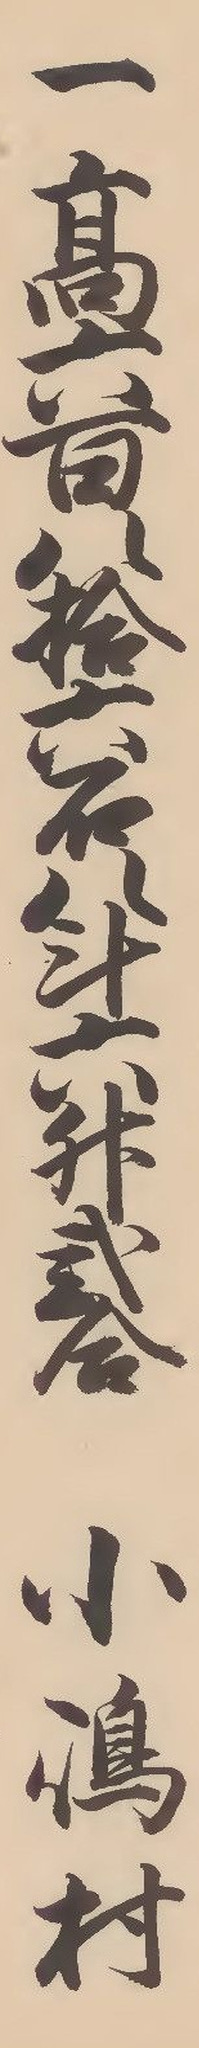一高六百八拾六石八斗六升弐合小嶋村
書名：武蔵国郷帳　下
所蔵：国立公文書館 National Archives of Japan
